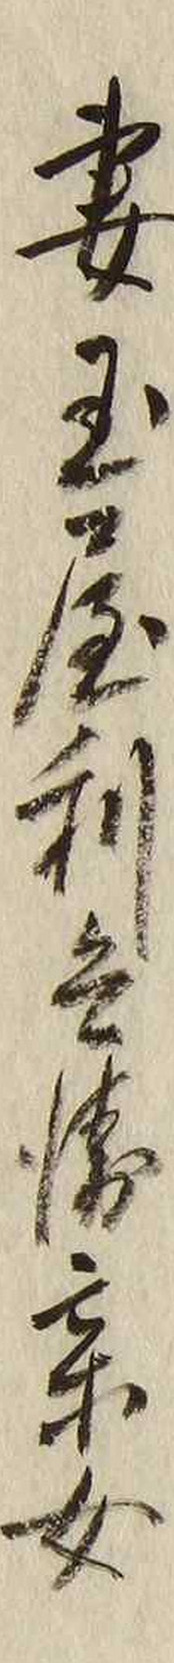妻玉屋利兵衛某女

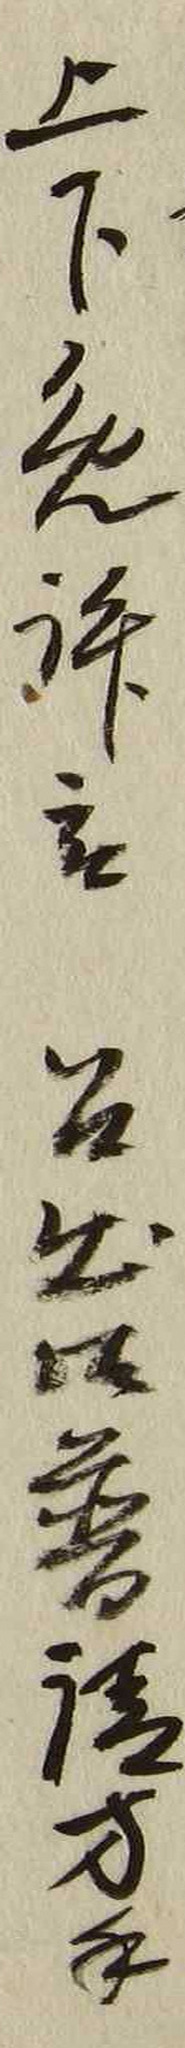上下免許被召出御普請方手
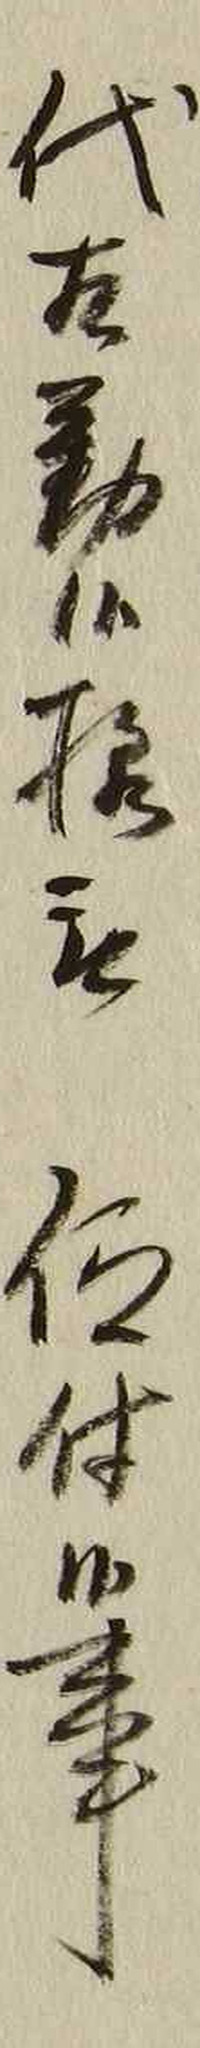代相勤候様被仰付候事
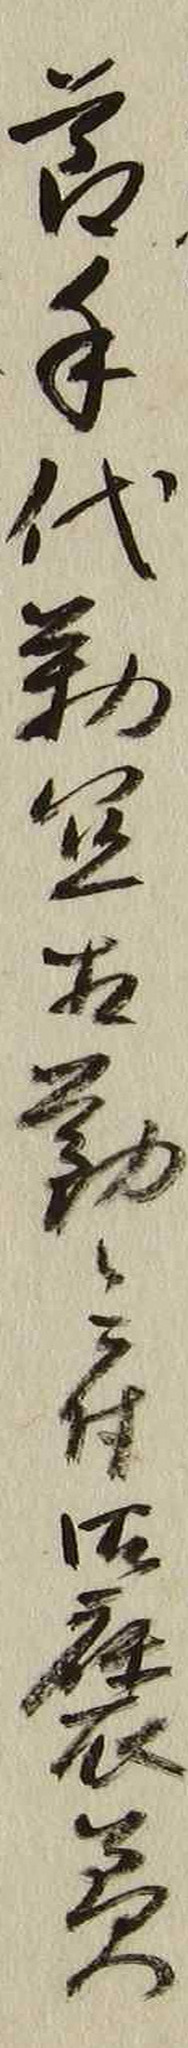節手代勤宜相勤候ニ付御褒美
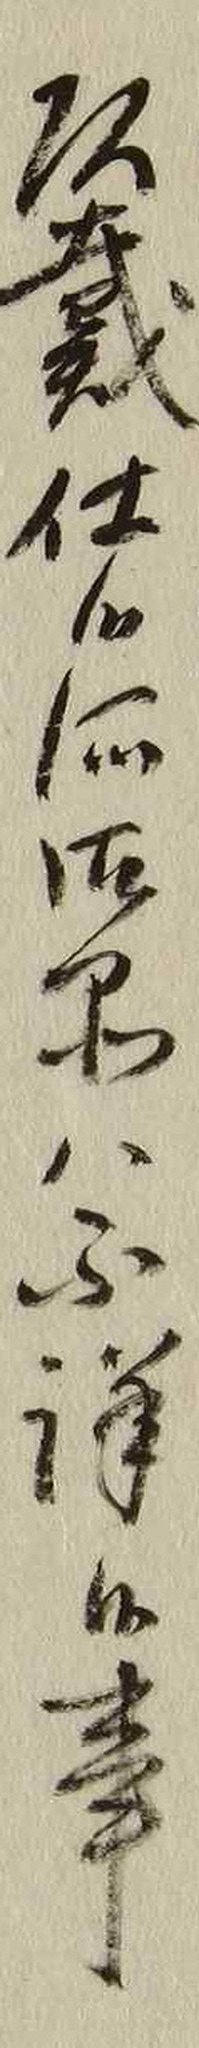頂戴仕候所所品ハ不詳候事
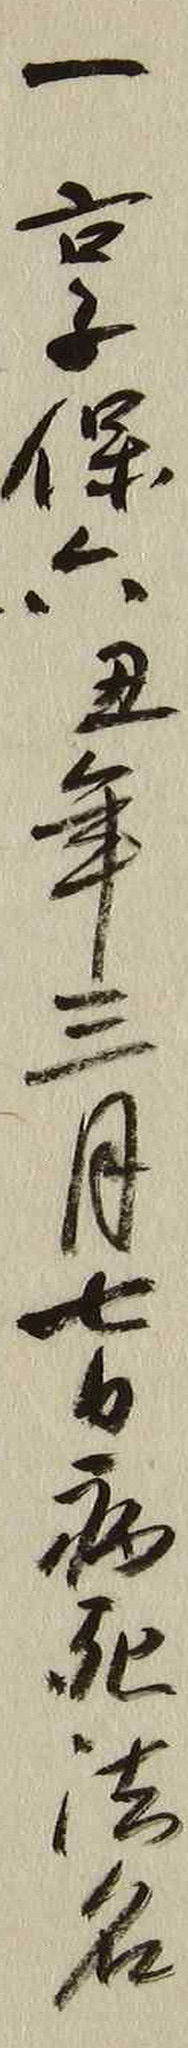一享保六丑年三月七日病死法名
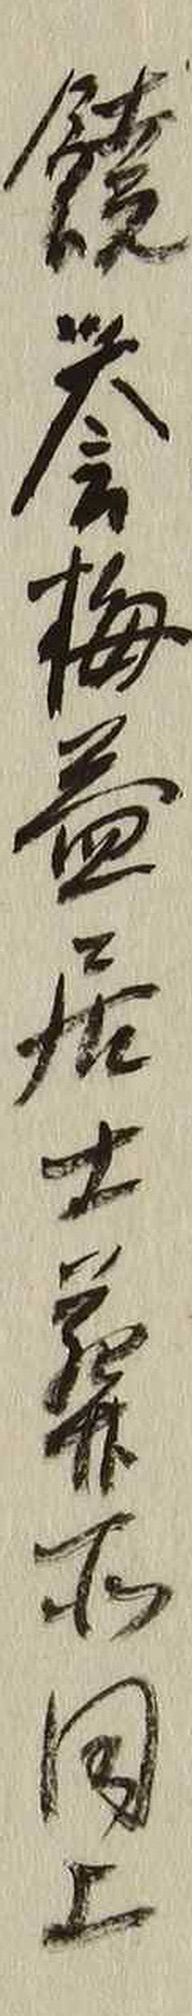鏡誉梅益居士葬所同上
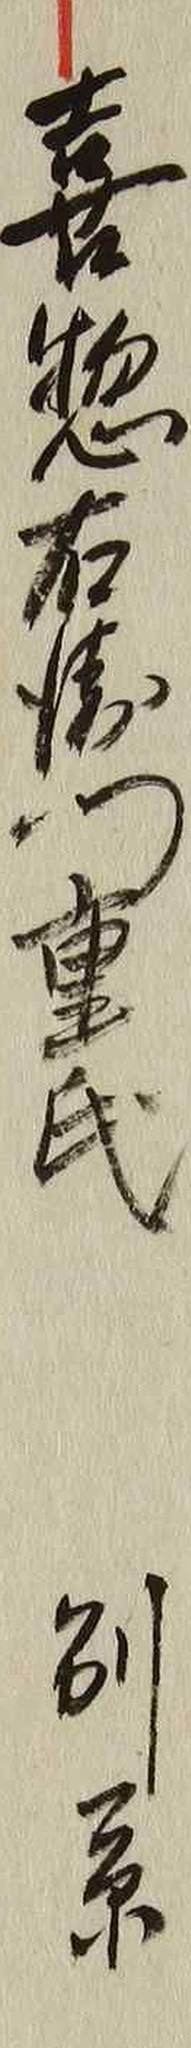喜惣右衛門重氏別系
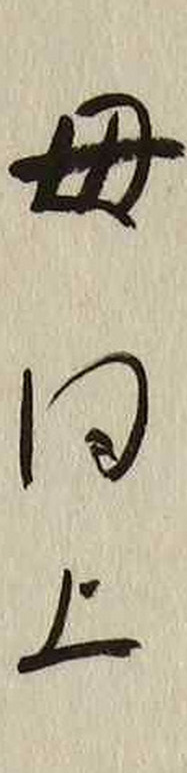母同上
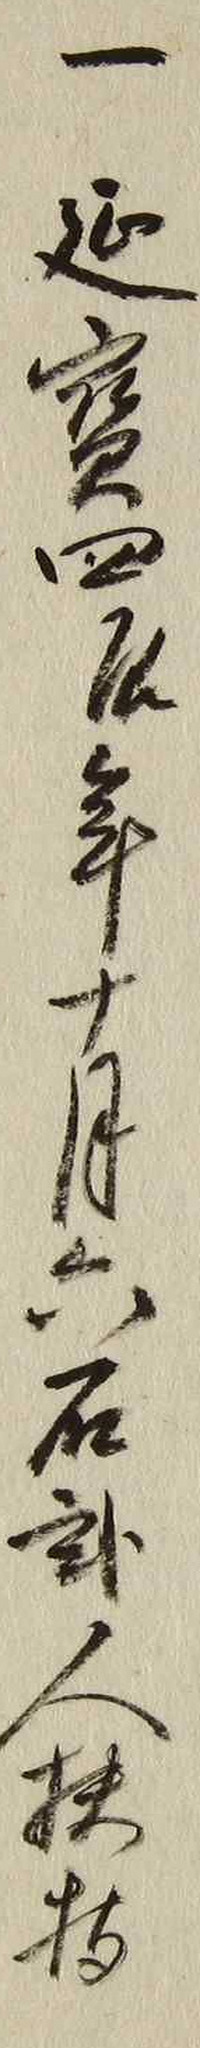一延宝四辰年十月六石弐人扶持
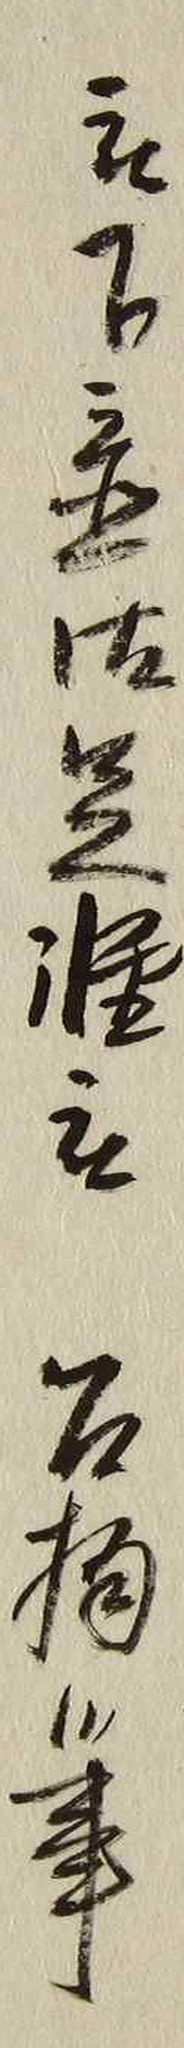被下置御足軽被召抱候事
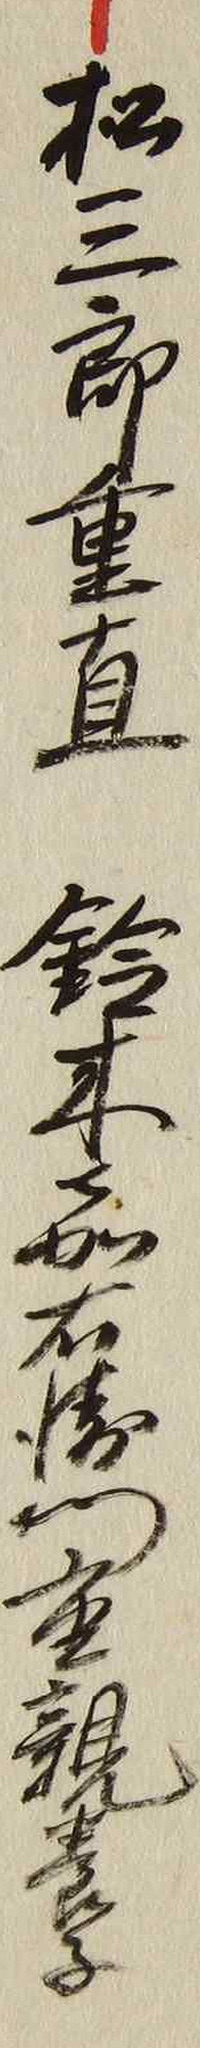松三郎重直鈴木嘉右衛門重親養子
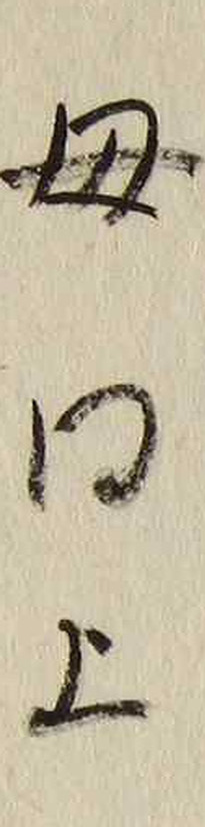母同上

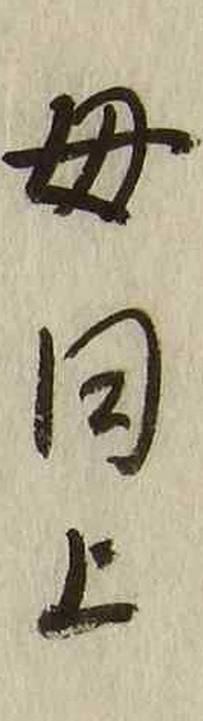母同上
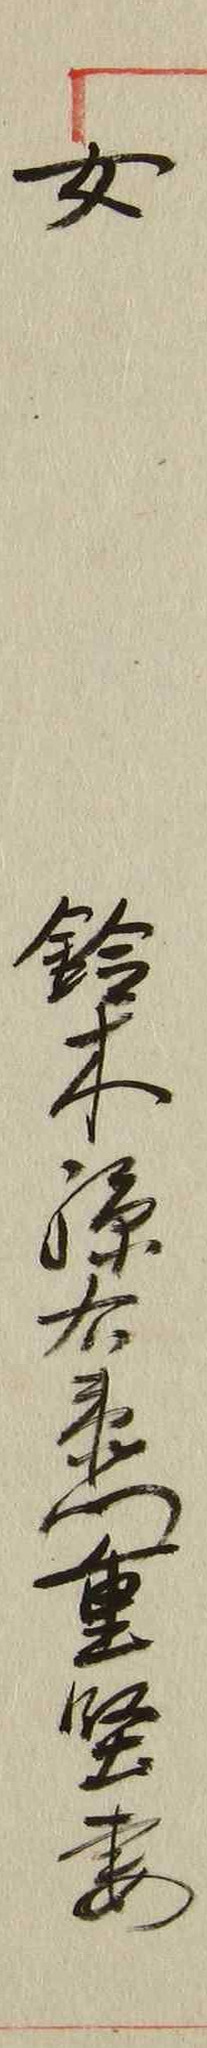女鈴木孫右衛門重堅妻
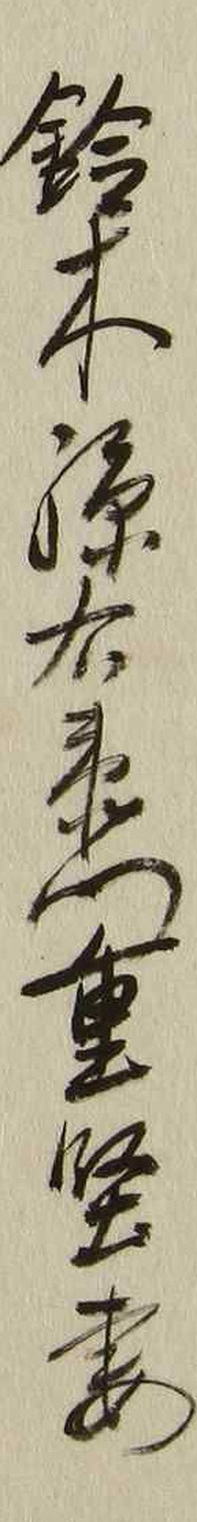女鈴木孫右衛門重堅妻
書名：諸士系譜　巻之353　す之部3
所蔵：会津若松市立会津図書館
